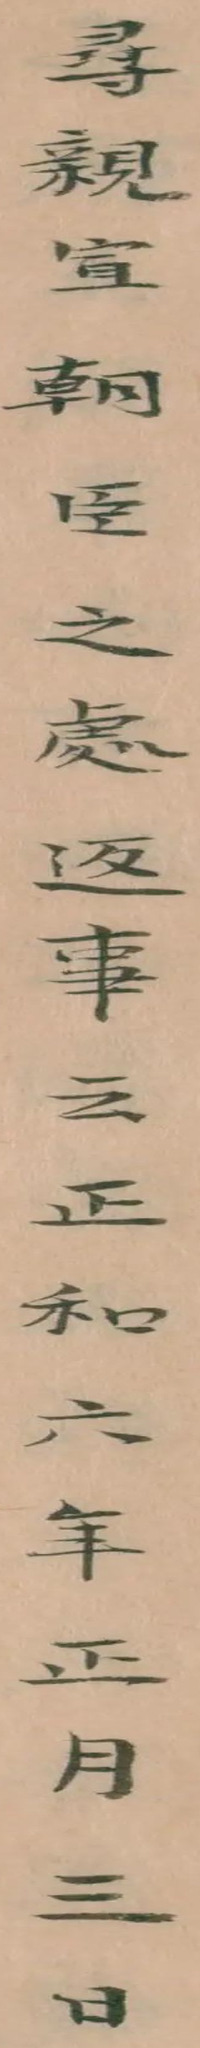尋親宜朝臣之処返事云正和六年正月三日
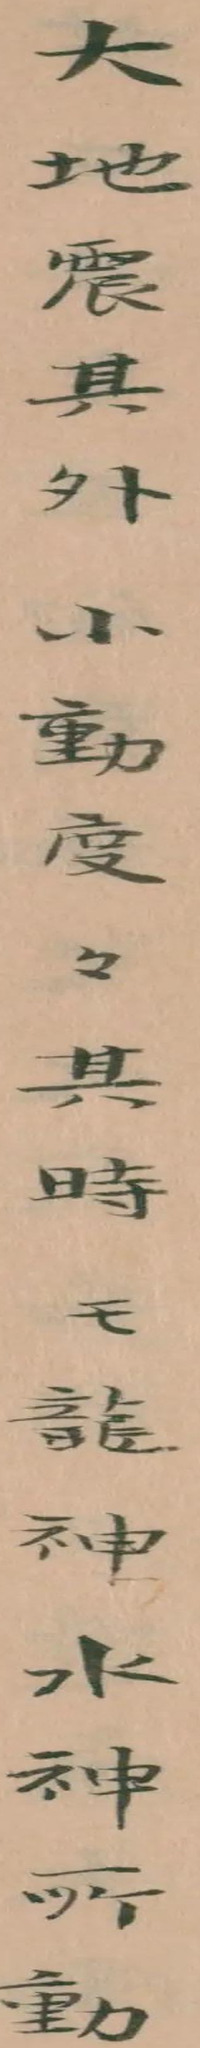大地震其外小動度々其時モ龍神水神所動
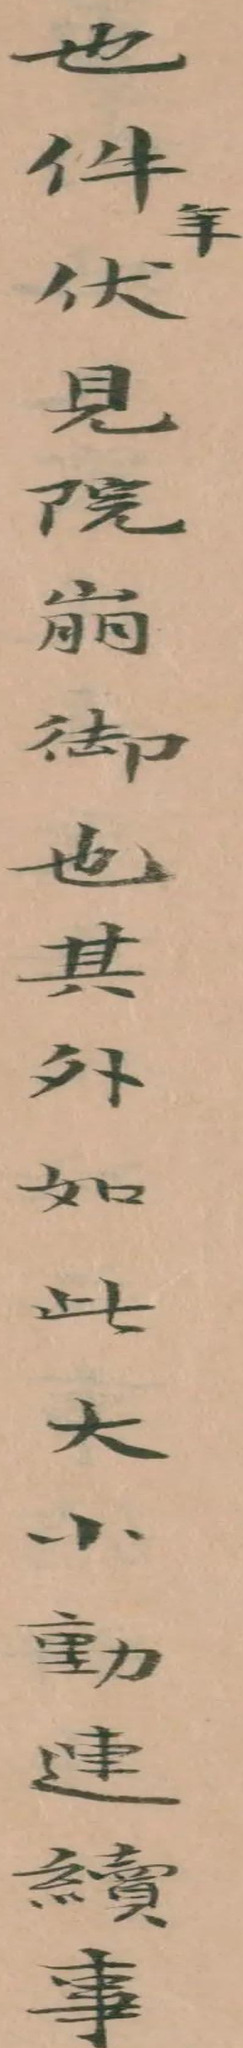也件年伏見院崩御也其外如此大小動連続事
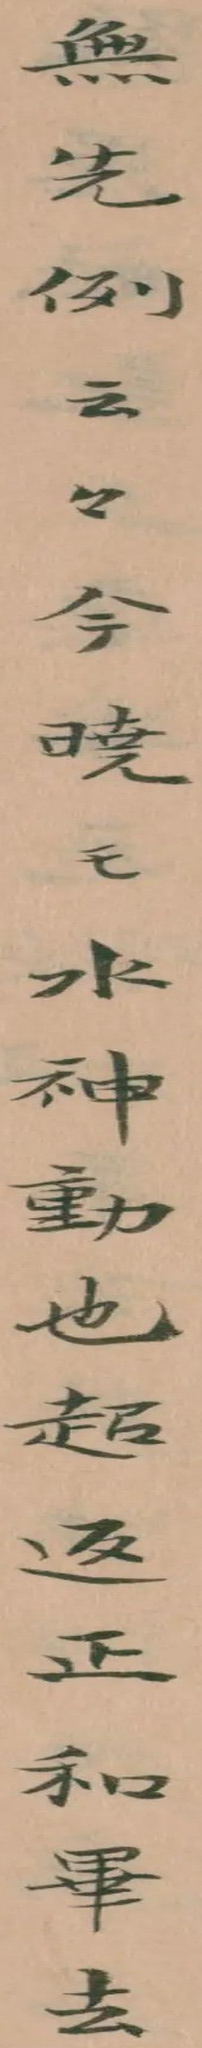無先例云々今暁モ水神動也超返正和畢去
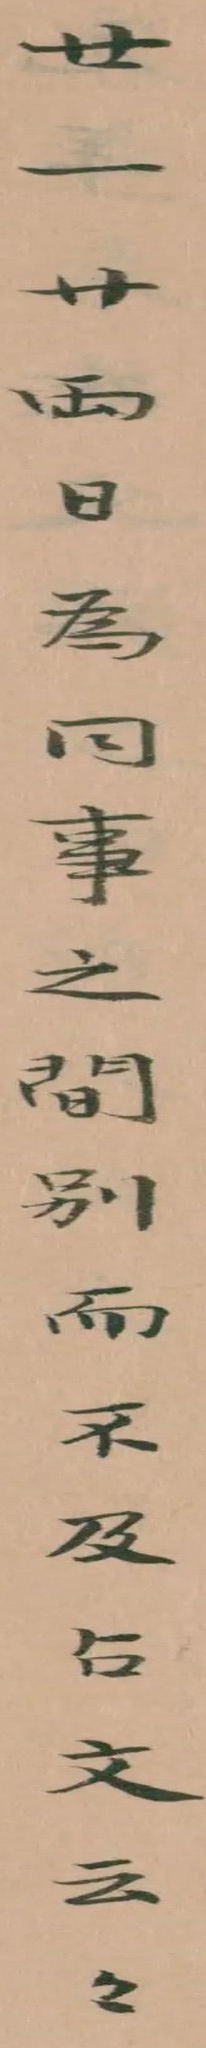廿一廿両日為同事之間別而不及占文云々
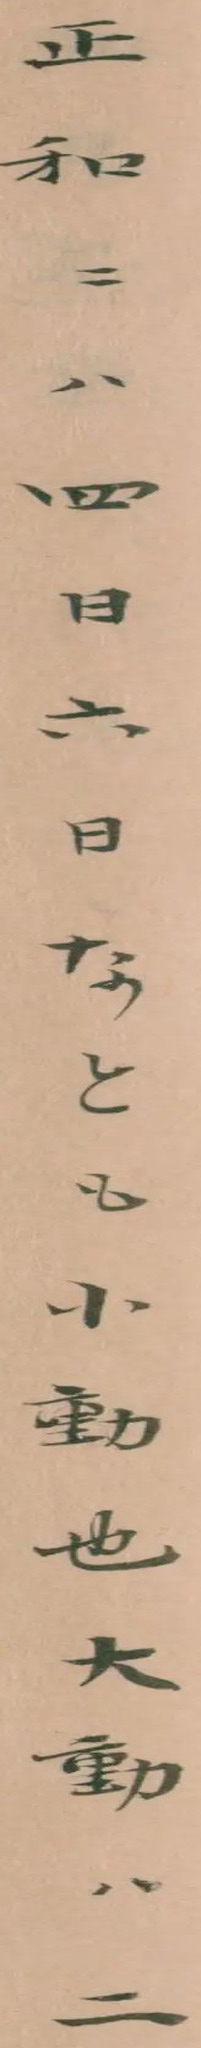正和ニハ四日六日なとも小動也大動ハ二
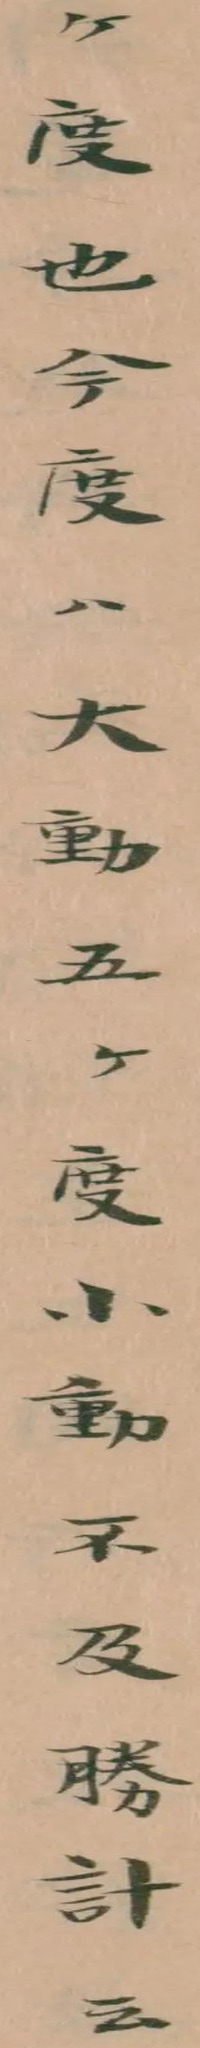ヶ度也今度ハ大動五ヶ度小動不及勝計云
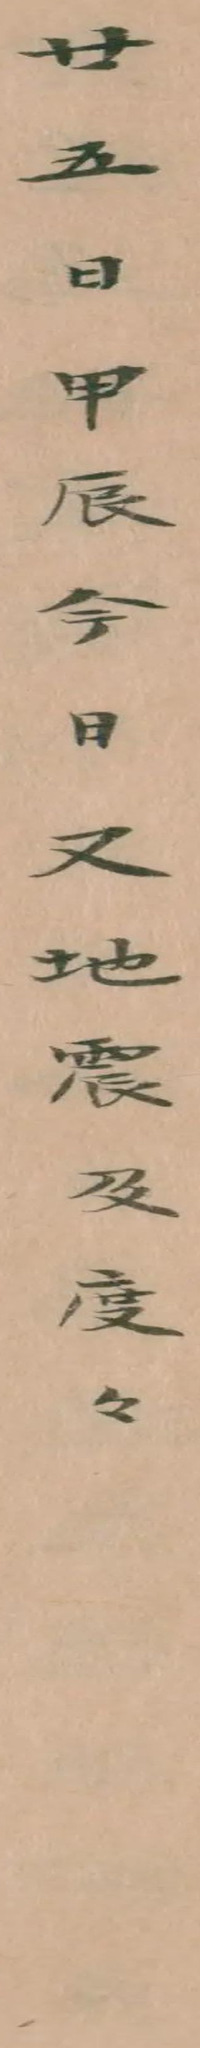廿五日甲辰今日又地震及度々
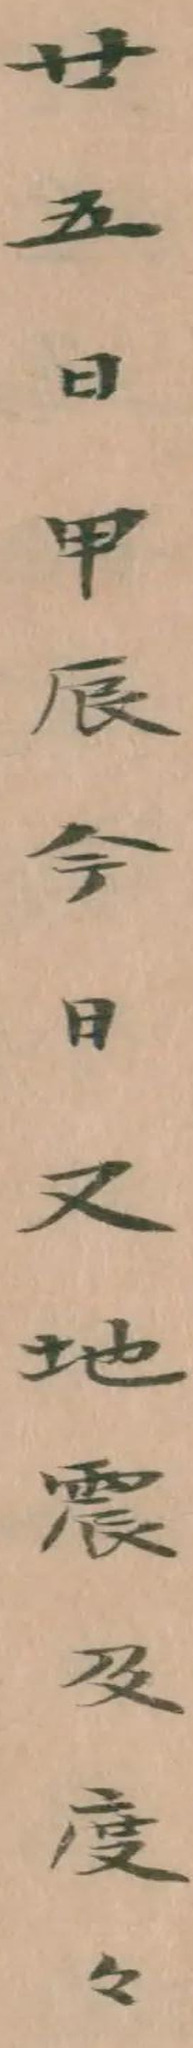廿五日甲辰今日又地震及度々
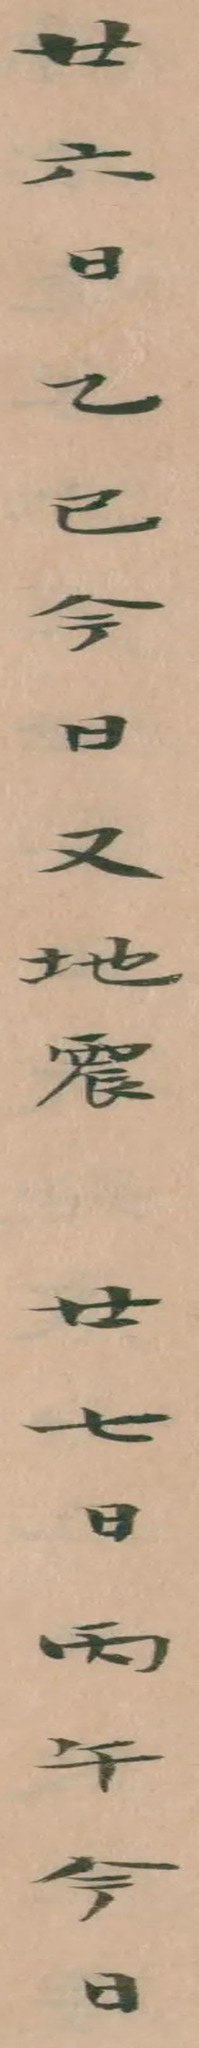廿六日乙巳今日又地震廿七日丙午今日
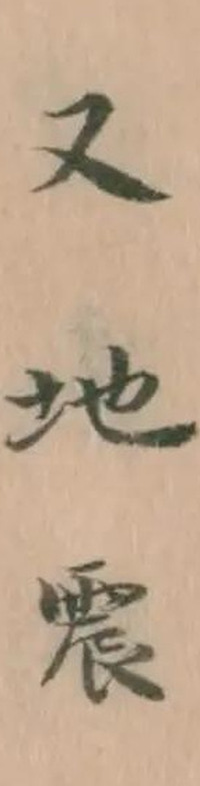又地震
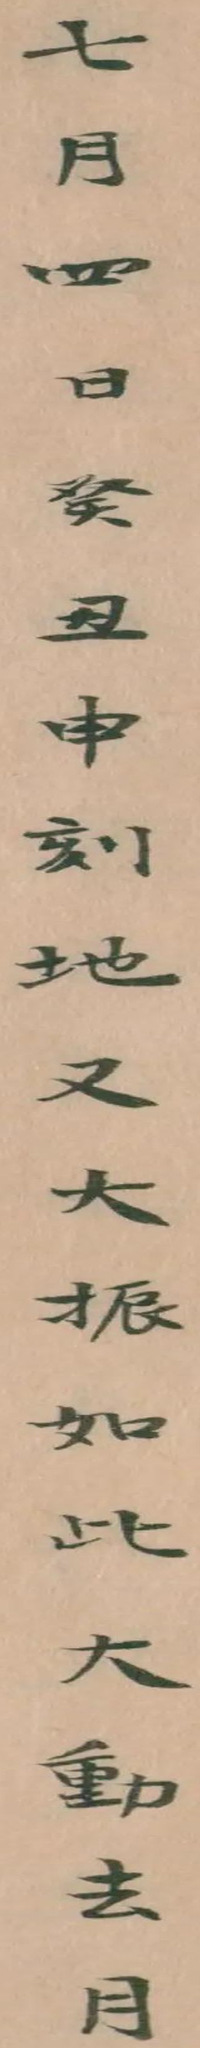七月四日癸丑申刻地又大振如此大動去月
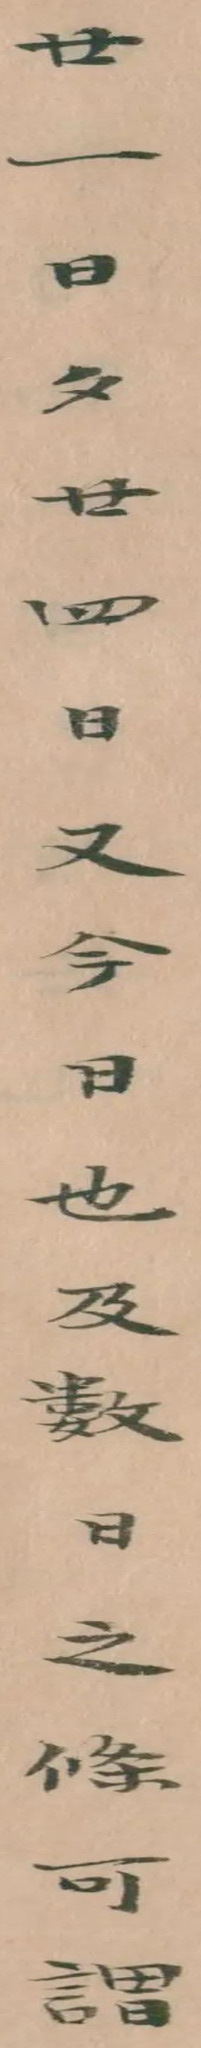廿一日夕廿四日又今日也及数日之条可謂
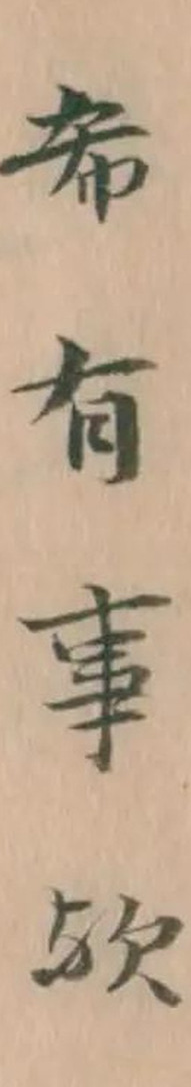希有事歟
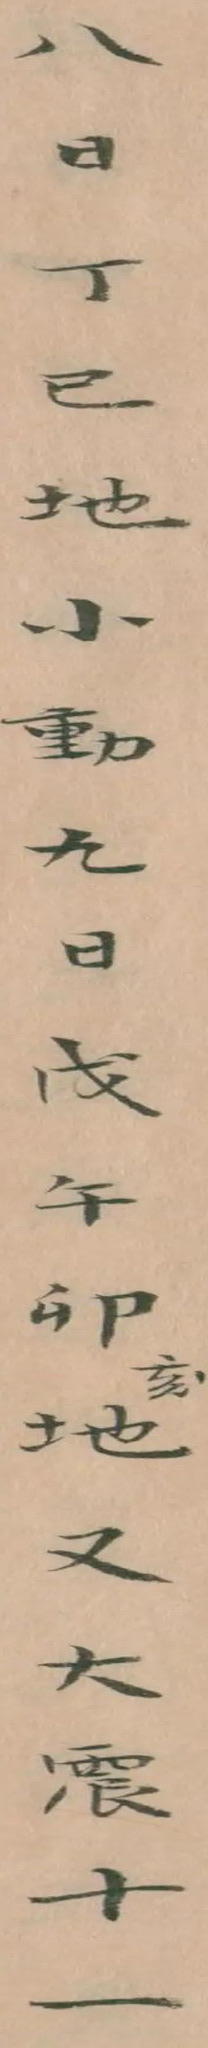八日丁巳地小動九日戊午卯刻地又大震十一

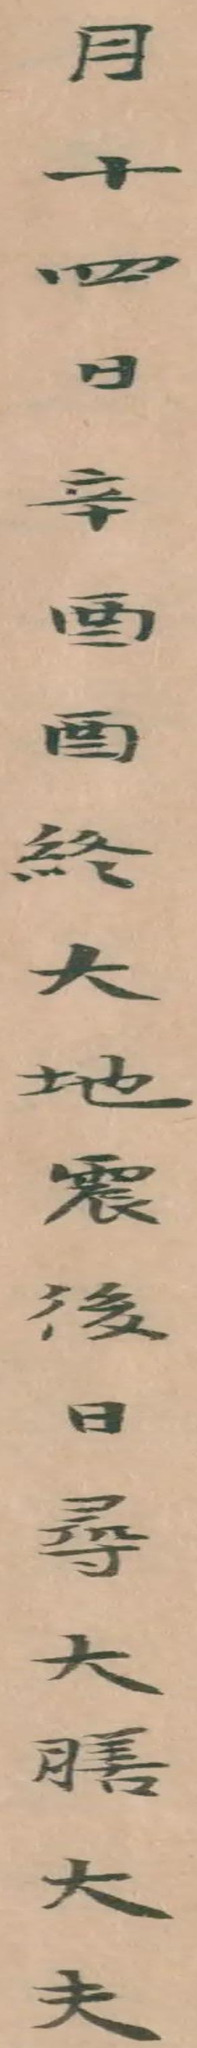月十四日辛酉酉終大地震後日尋大膳大夫
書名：地災撮要. 巻5-6(地震之部)
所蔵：国立国会図書館 National Diet Library, JAPAN
